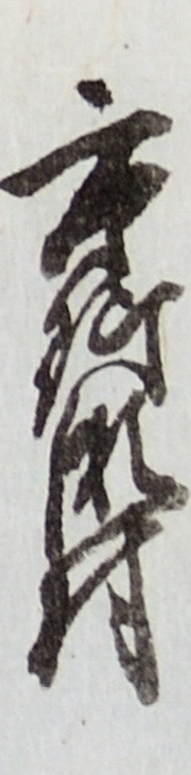市野瀬村
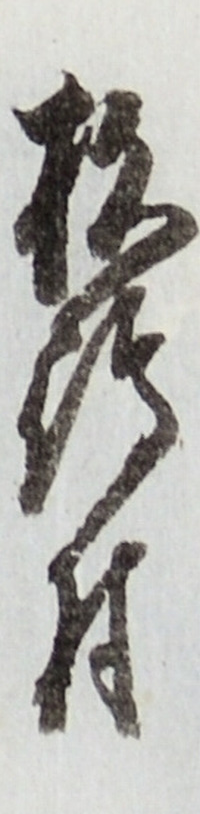杉樽村
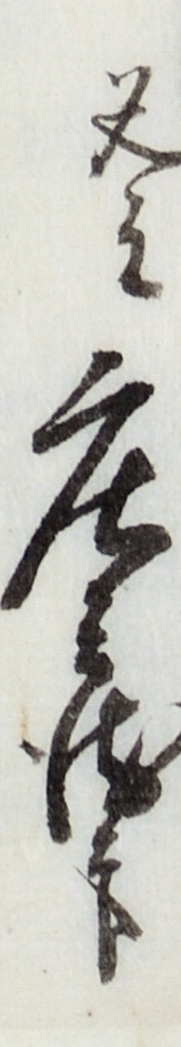名主庄兵衛印
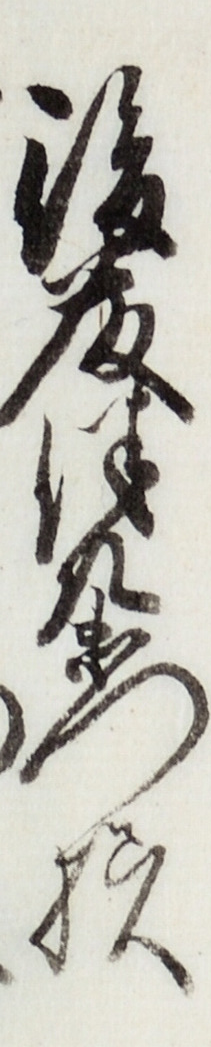後藤伴左衛門様
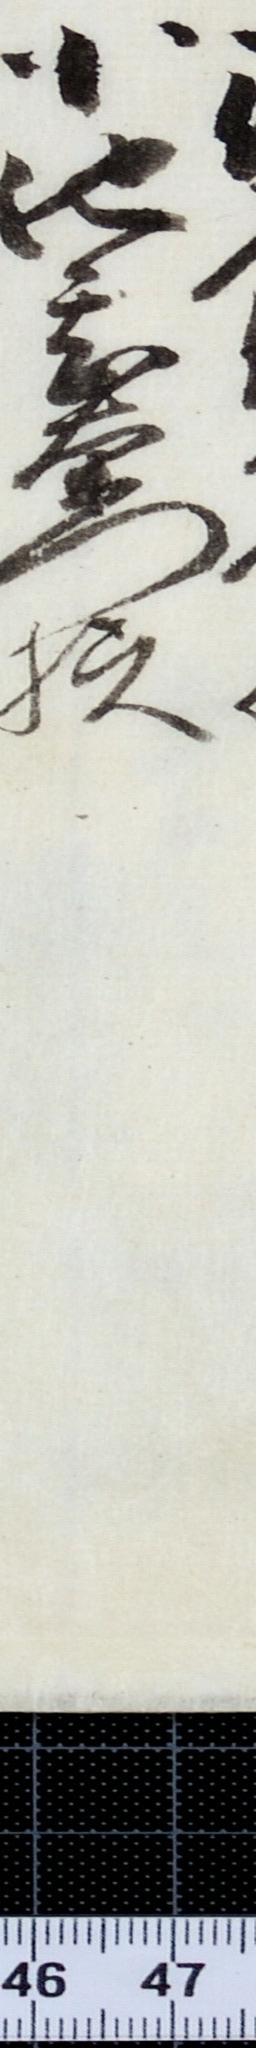小池甚右衛門様
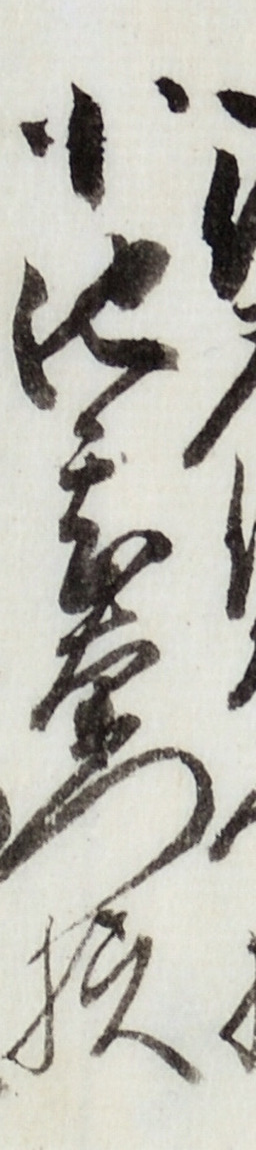小池甚右衛門様
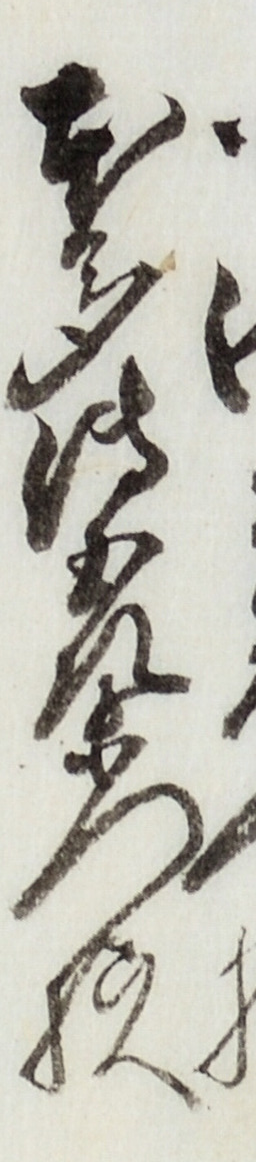本多伝五左衛門様
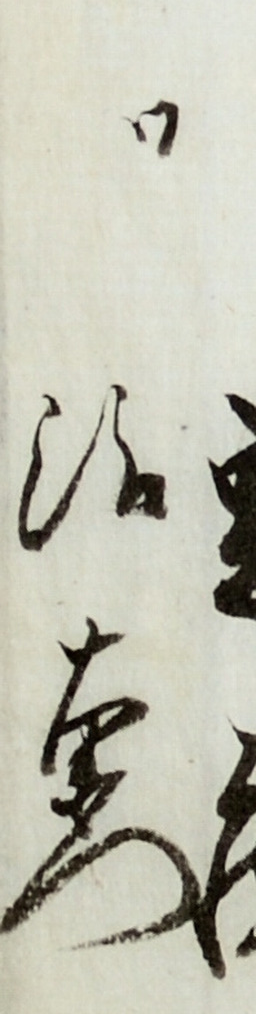同治右衛門

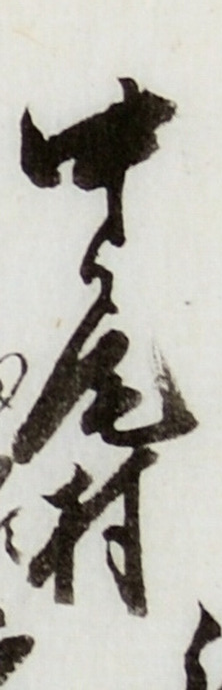中尾村
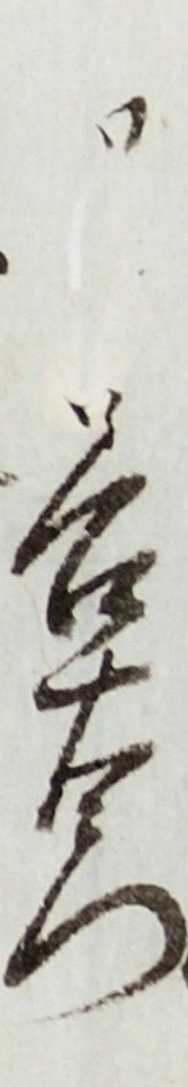同善右衛門
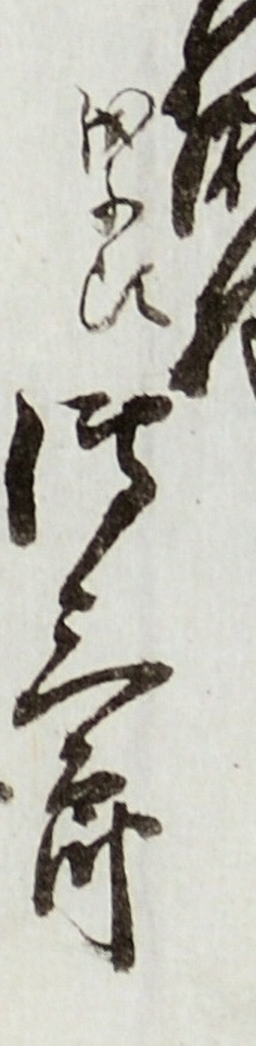伐子頭伝三郎
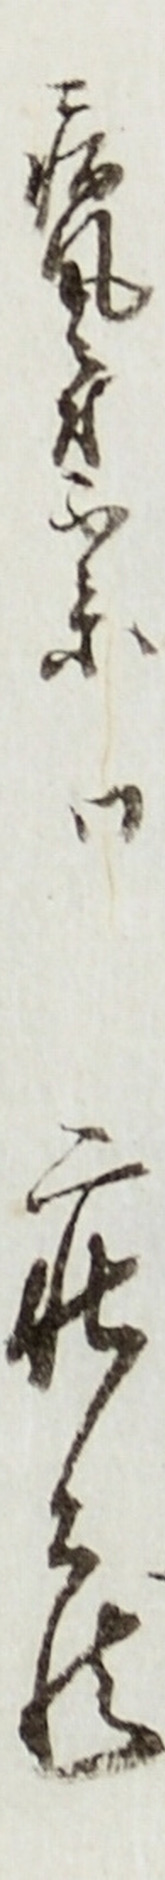病気ニ付不参同荘蔵
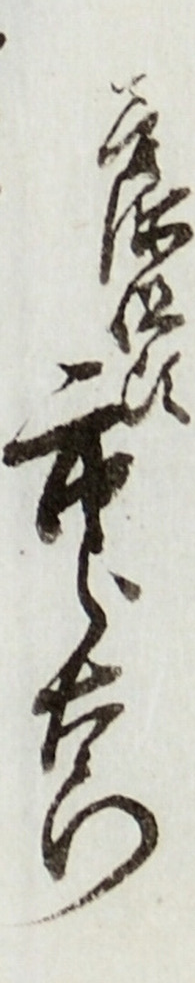同善右衛門
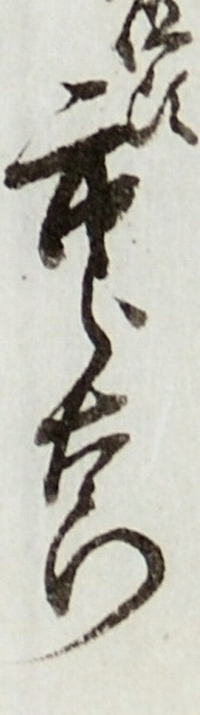同善右衛門
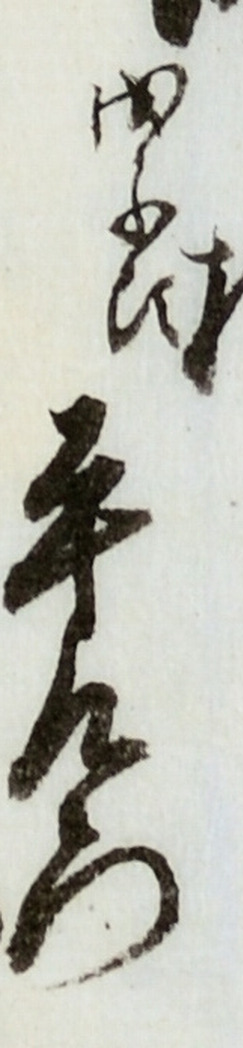伐子頭平左衛門
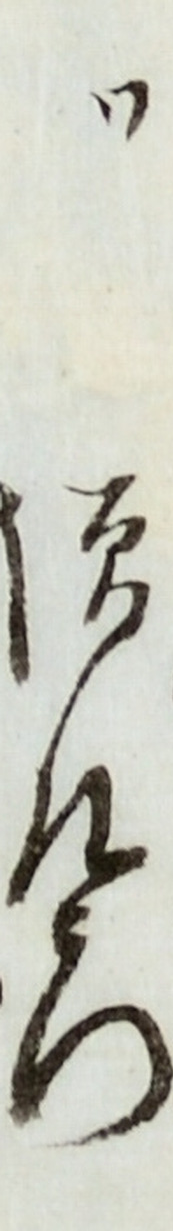同増左衛門
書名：御薪方掟控
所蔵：伊那市立高遠町図書館・合同会社AMANE
